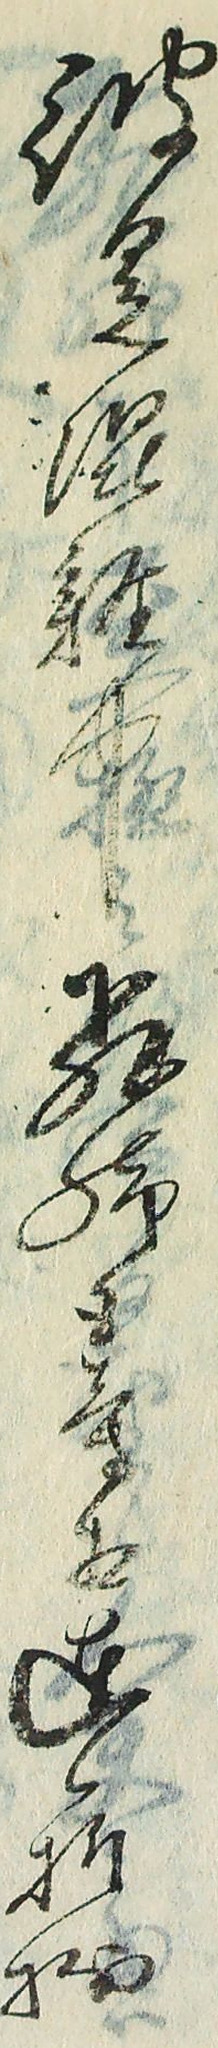彼是混雑中飛脚も旁相達候折柄
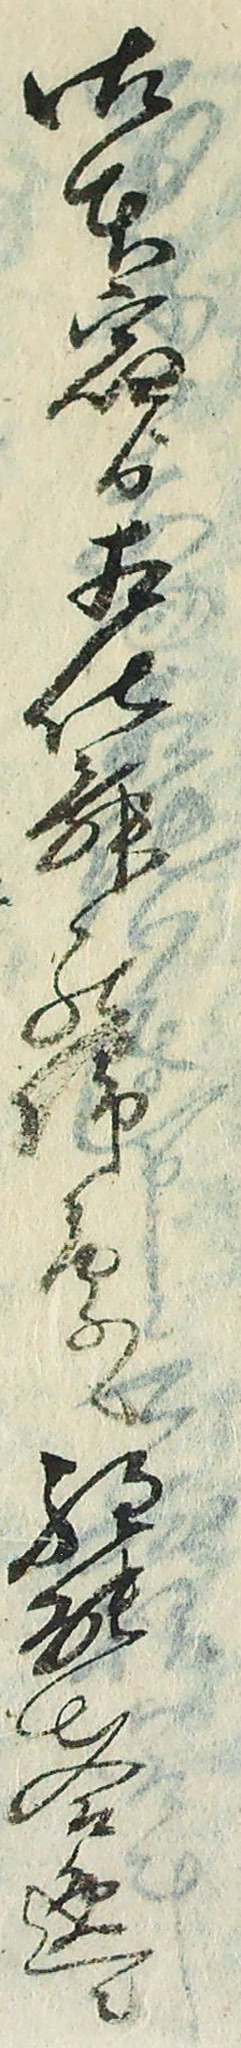御本宿ゟ相仕舞罷帰処候程能出合逸々
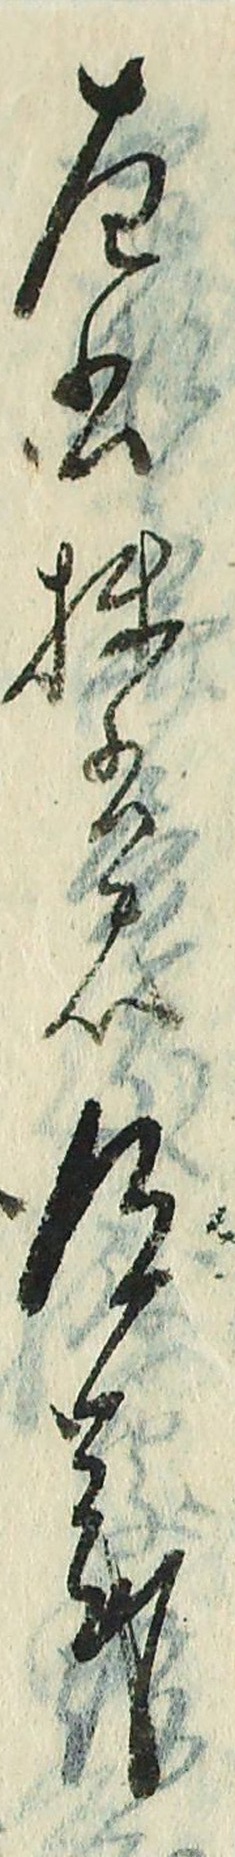左書株書を以得御意候
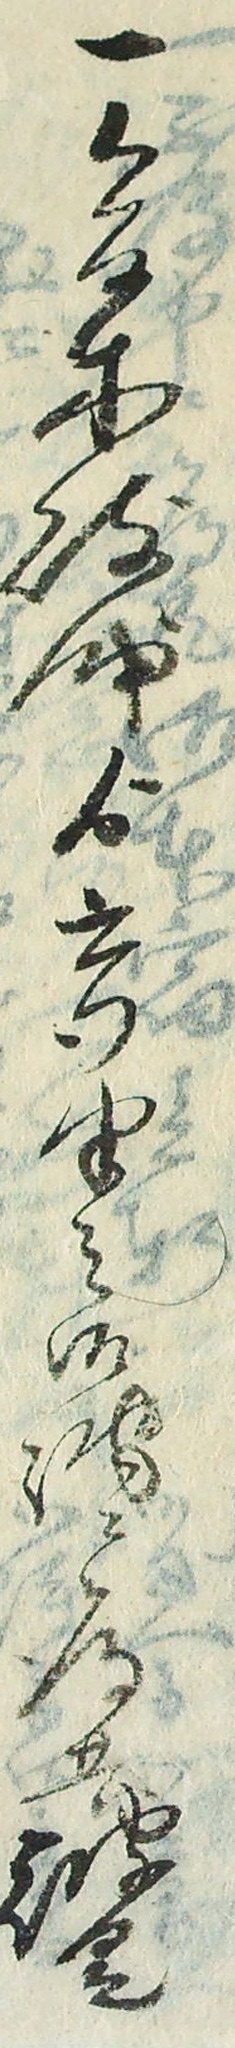一今日木岐浦ゟ六つ半之御伝に候得共彼是
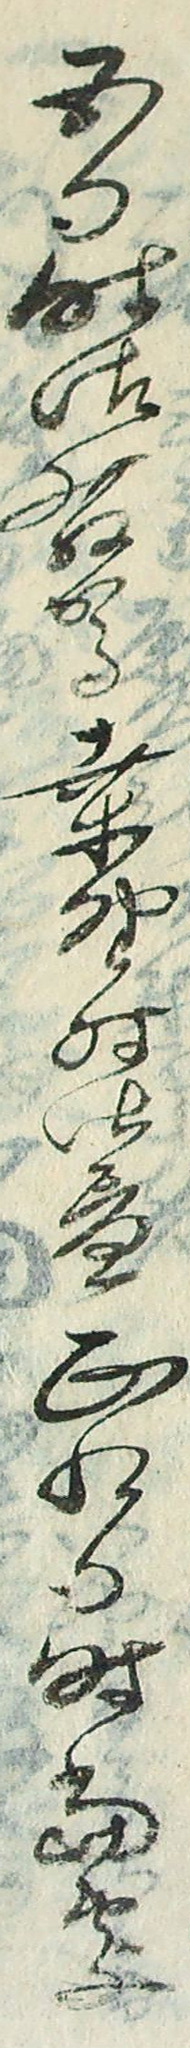五つ時御発駕桑野村御昼正九つ時当処
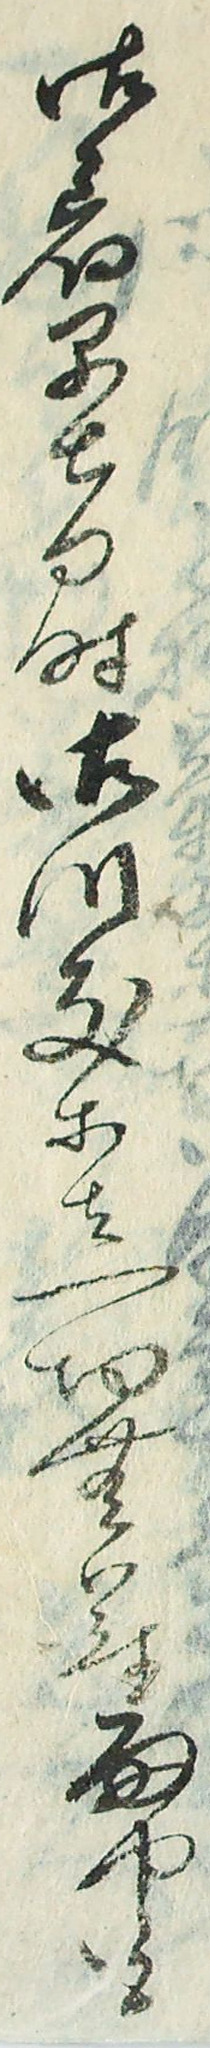御着早七つ時御川支等は一切無御座雨中も

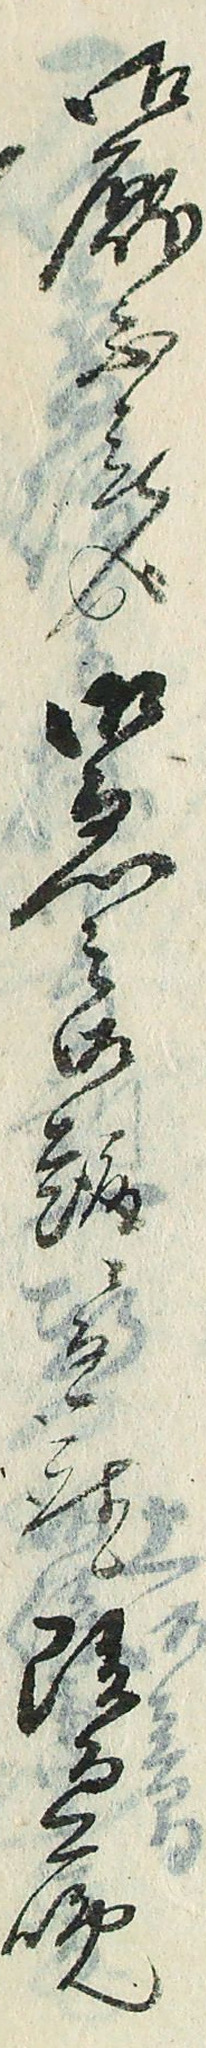御厭不被成御急之御趣にて御座候随て今晩
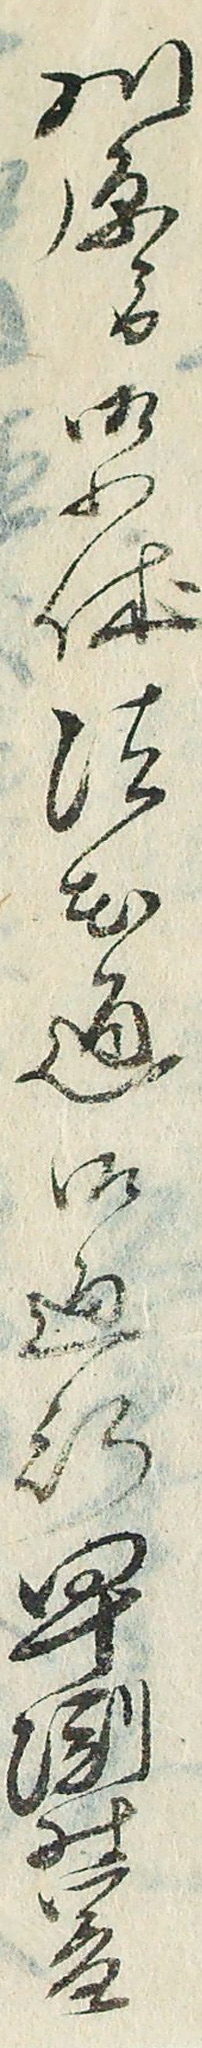川原にて御小休法花通御通行早淵村御昼
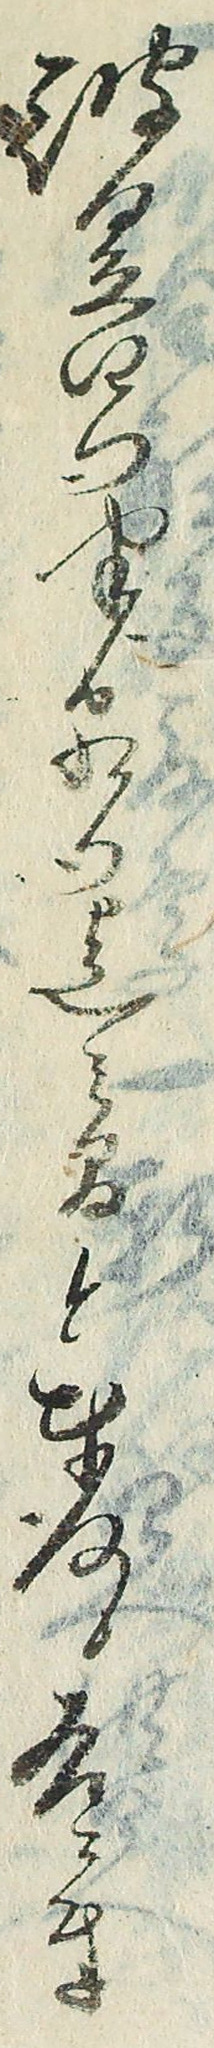彼是四つ半ゟ五つ迄之間と奉存候右に付
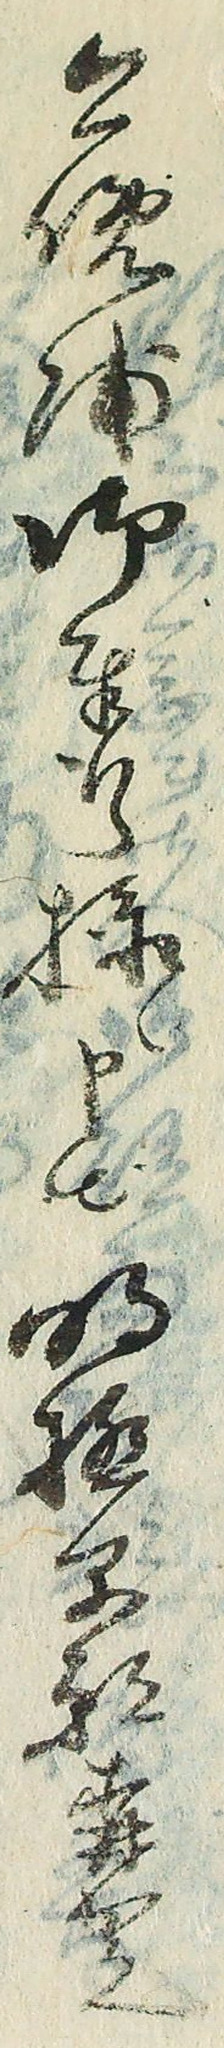今晩浦御奉行様へ申出明極早朝森賀
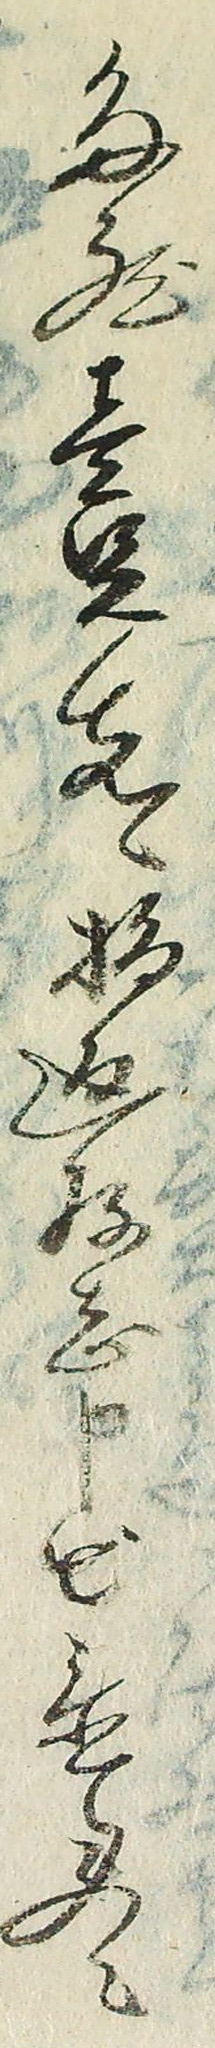多蔵壱足先へ指返存志申出置夫々
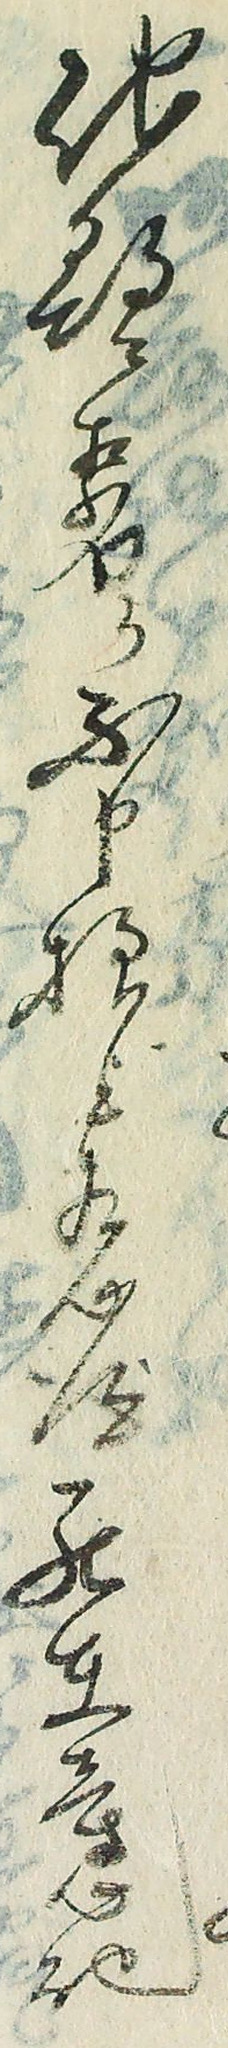他郡に相劣り不申様に相心得罷在旁心配
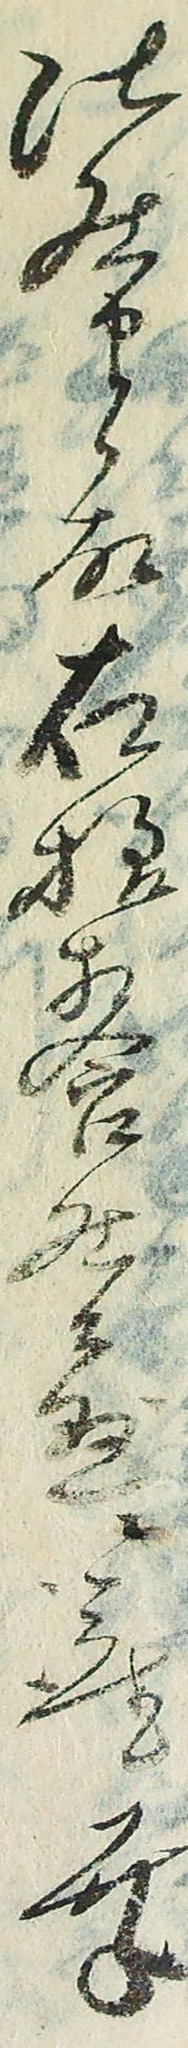仕居申候故右様相含居候懸に御座候幸
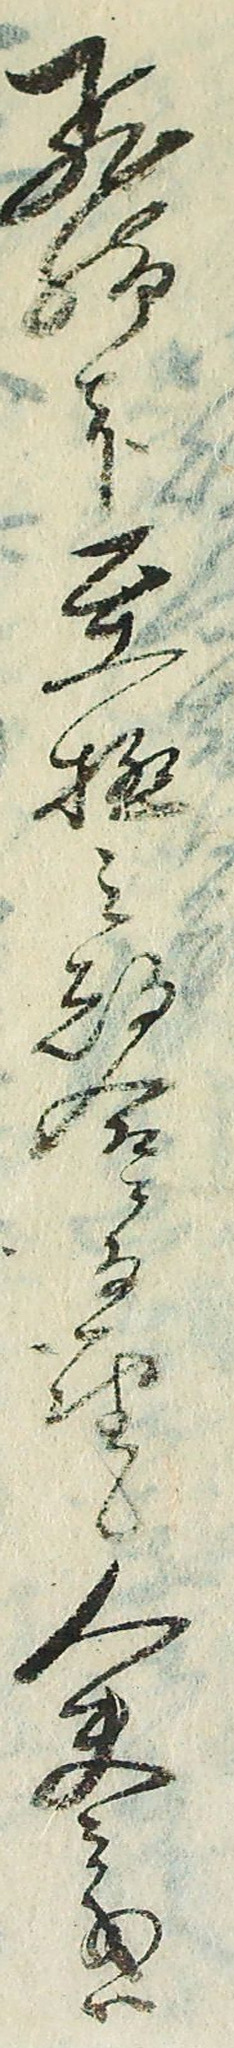飛脚被下至極之都合にて御座候人夫之義は
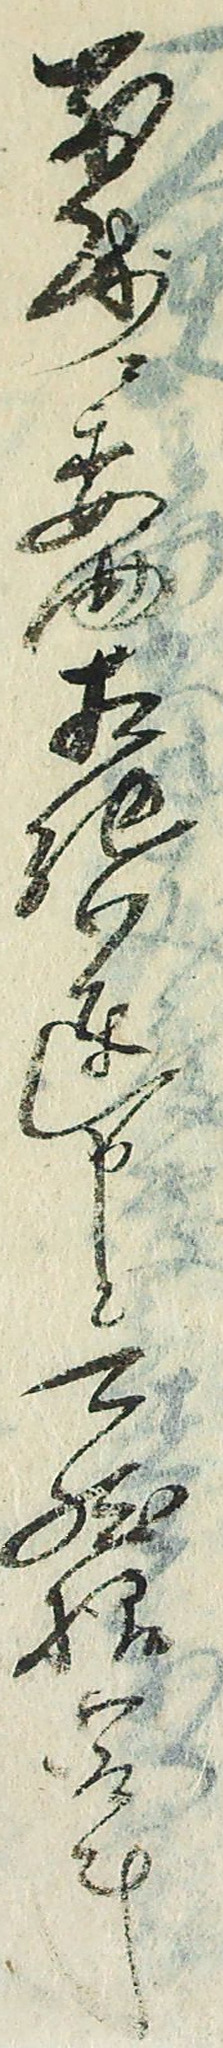別紙に委曲御達申候可然様御取計
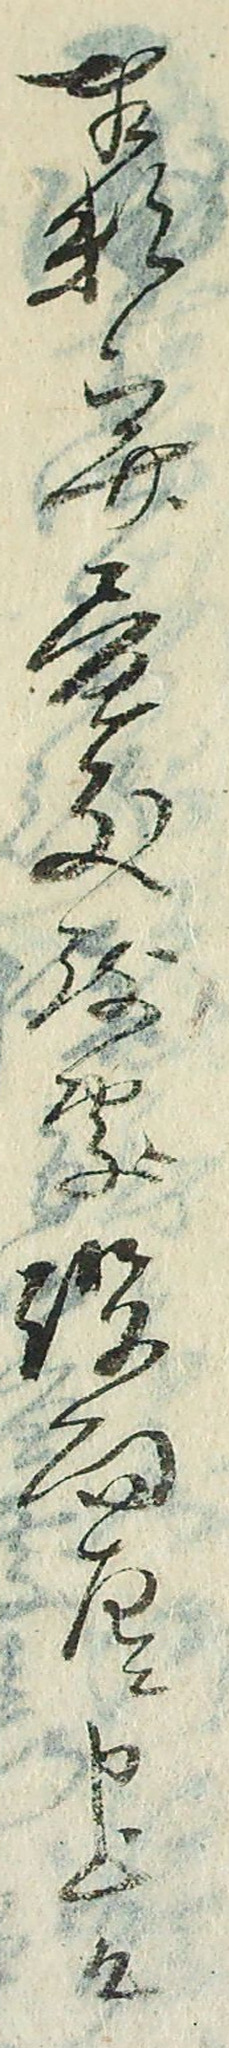奉頼候并昼支度致処役向左に申上候
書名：公辺御役人為御廻浦御立越諸御用一巻
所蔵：鳴門教育大学 Naruto University of Education
